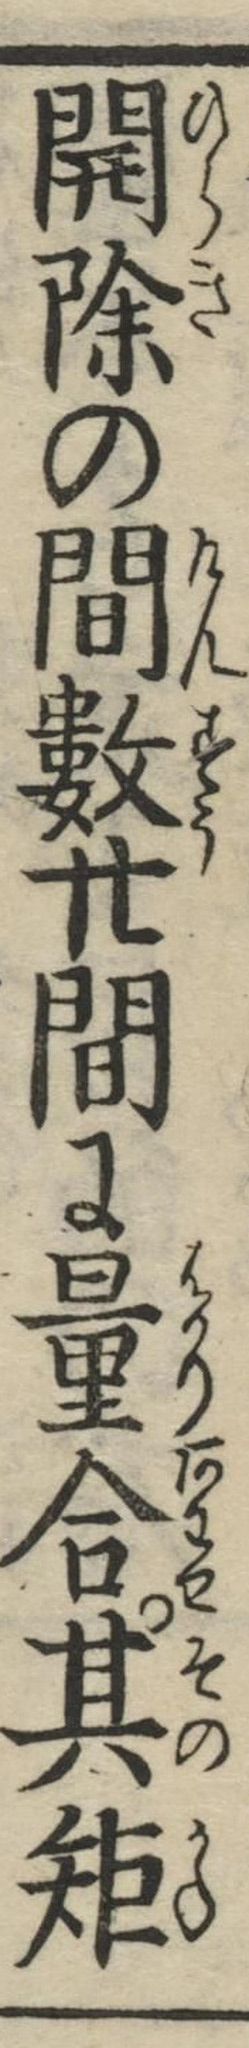開除の間数廿間に量合。其矩
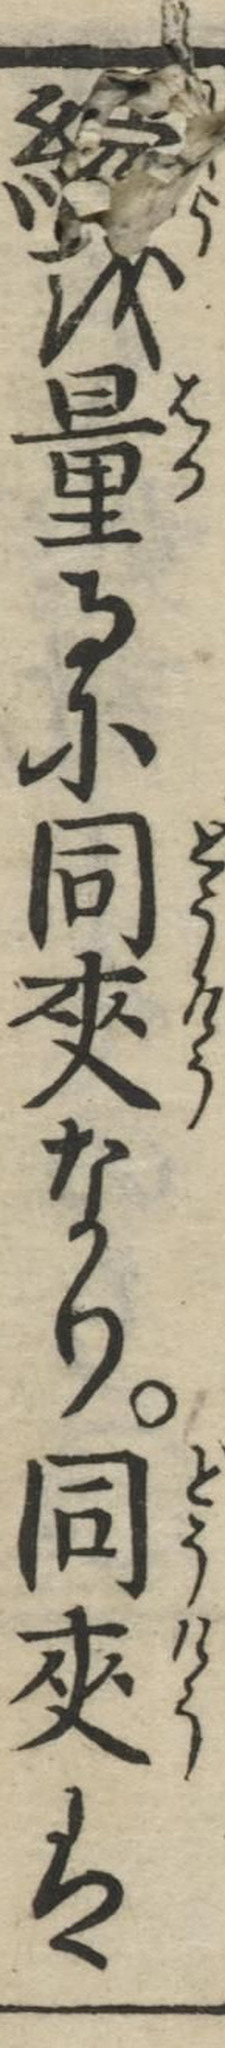縮を量るに同夾なり。同夾は
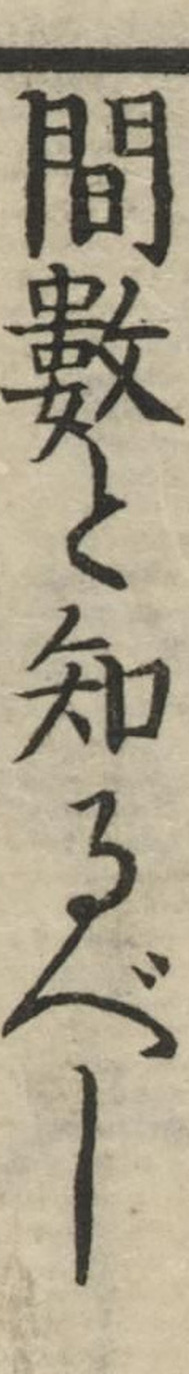間数と知るべし
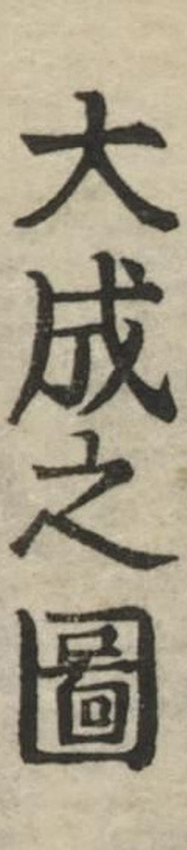大成之図
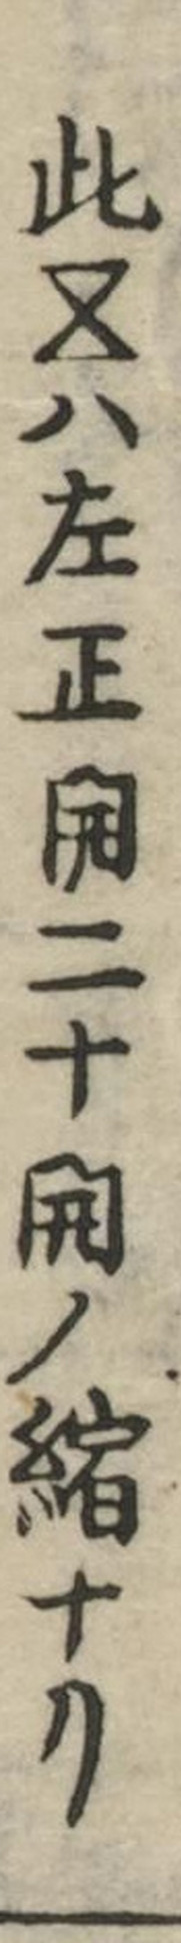此▽△は左正開二十開の縮なり
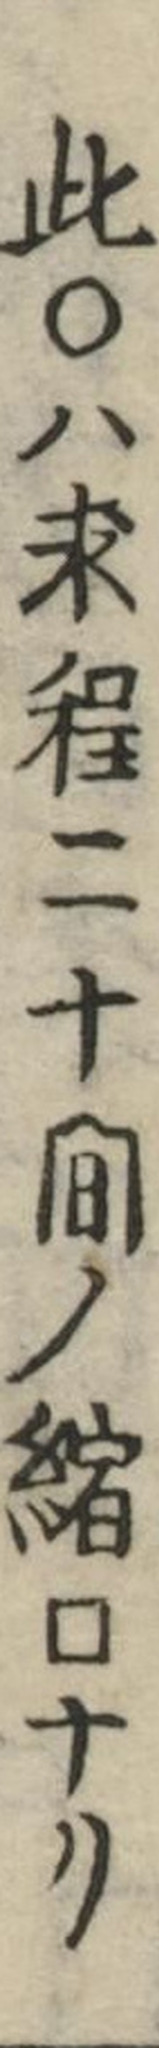此○は求程二十間の縮口なり
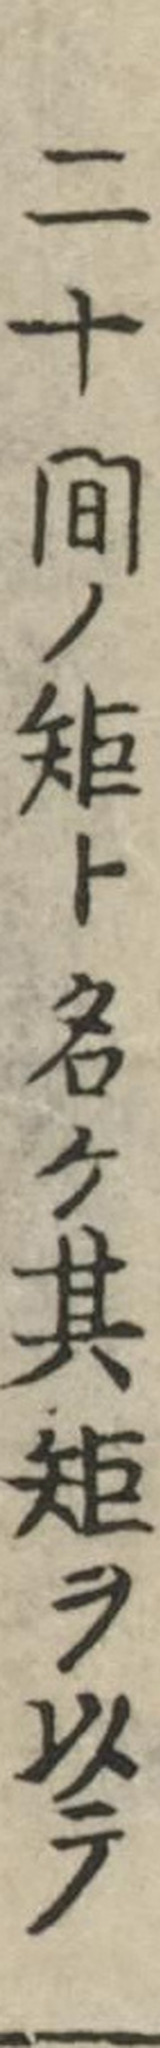二十間の矩と名け其矩を以て
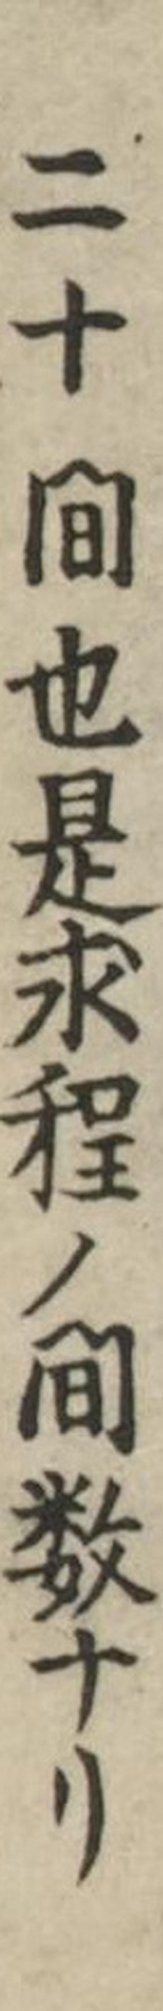二十間也是求程の間数なり

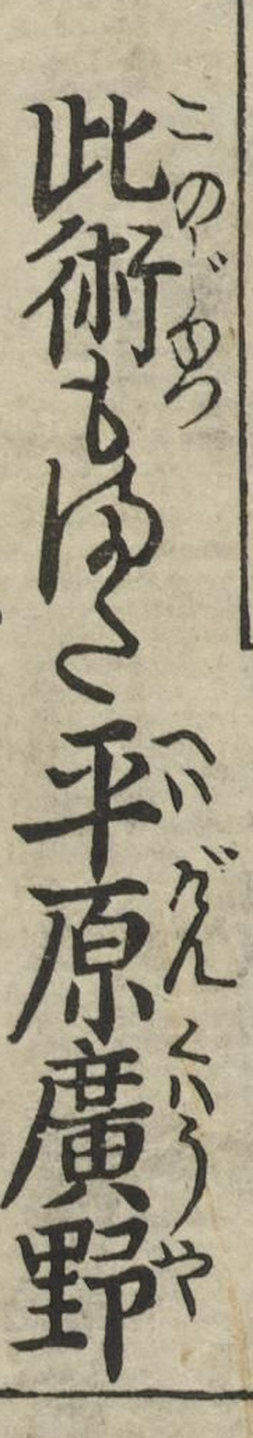此術もまた平原広野
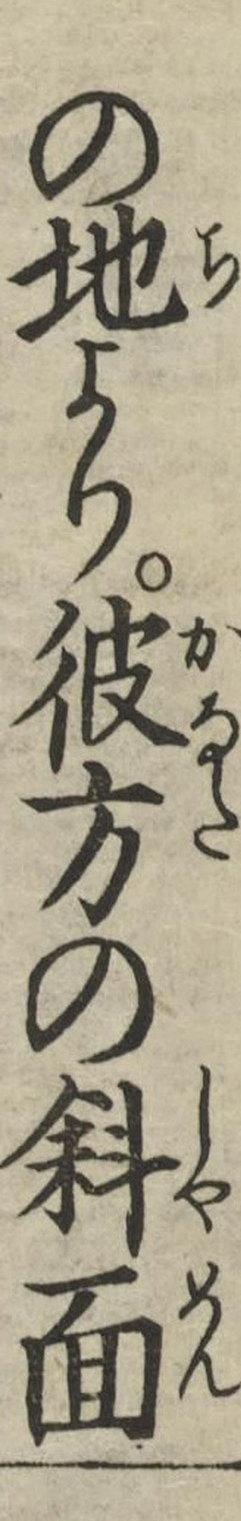の地より。彼方の斜面
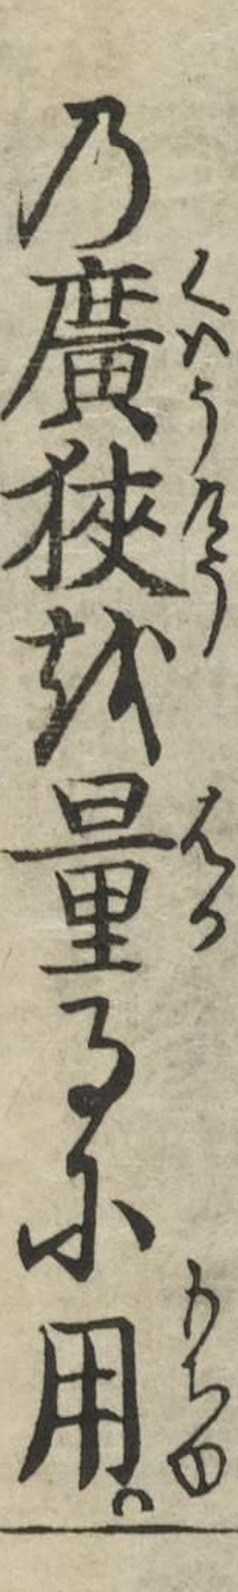の広狭を量るに用。
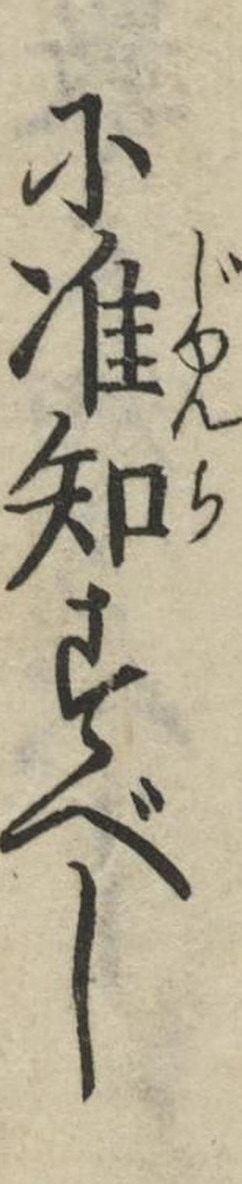に准知すべし
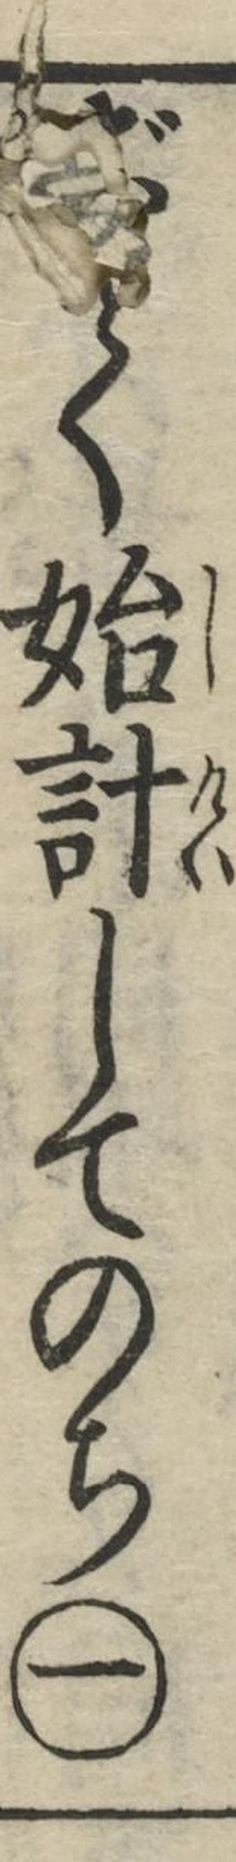ごとく始計してのち㊀
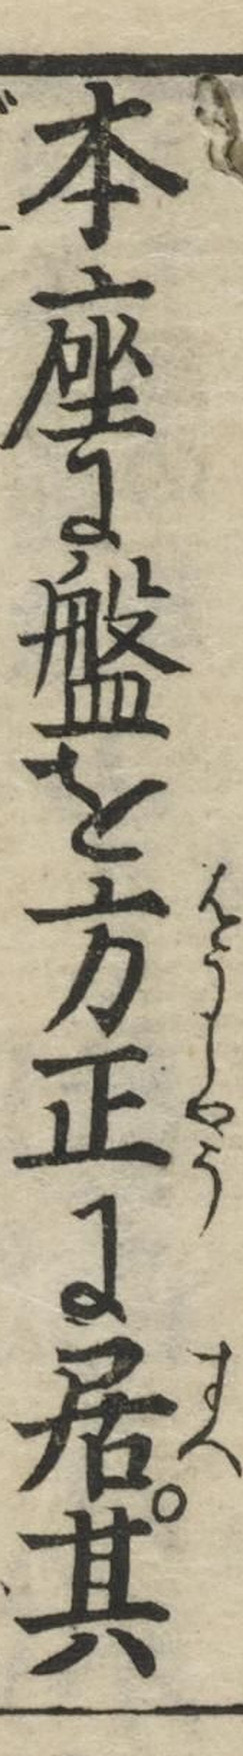本座に盤を方正に居。其
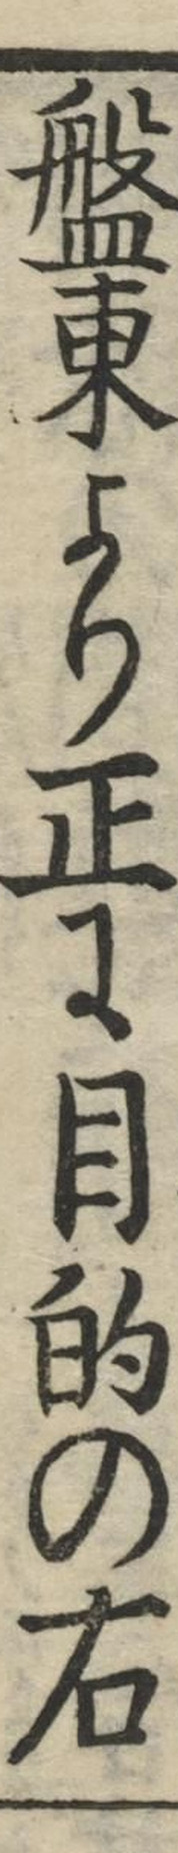盤東より正に目的の右
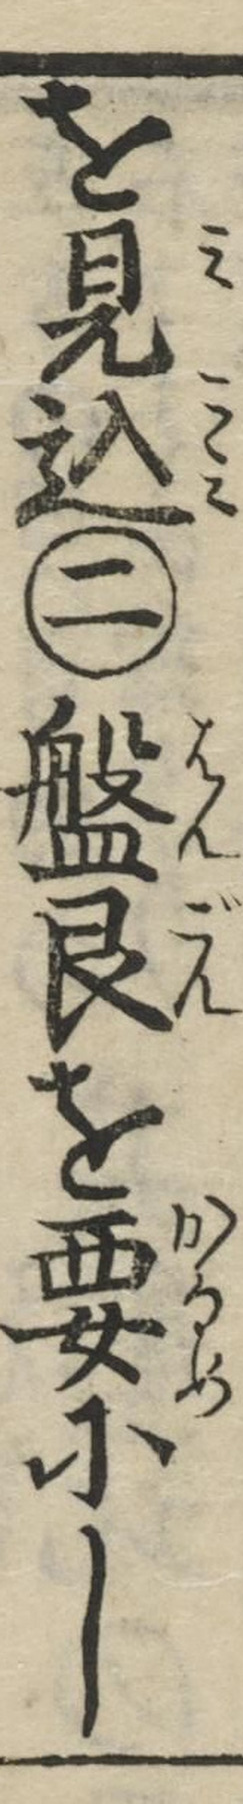を見込㋥盤艮を要にし
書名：量地指南　巻之三（内題）
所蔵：東京大学地震研究所図書室 Earthquake Research Institute Library, The University of Tokyo, JAPAN
